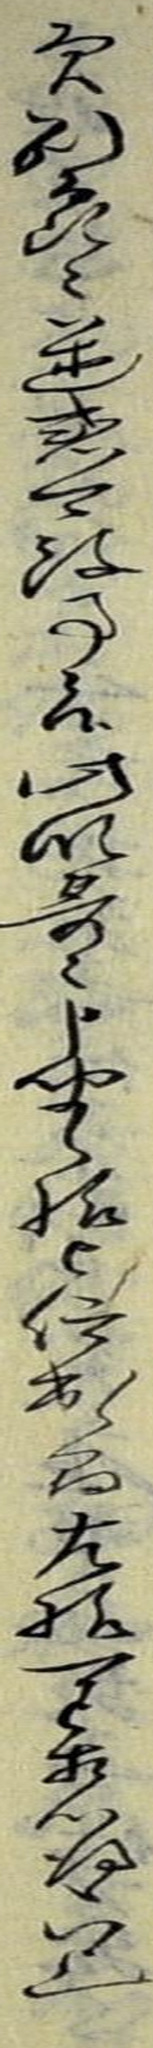而ハ別而頭々迷惑可致事ニ候此段寄々申聞候様被仰出候間左様可被相心得候以上
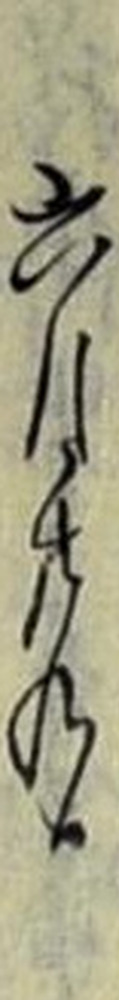六月廿九日
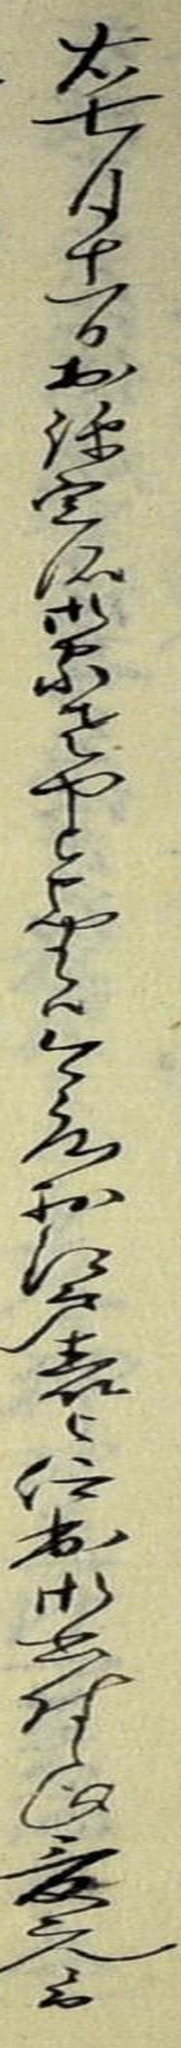右七月十一日於評定所御家老中被申聞候ハ今度於江戸表被仰出御書付之趣爰元ニ而
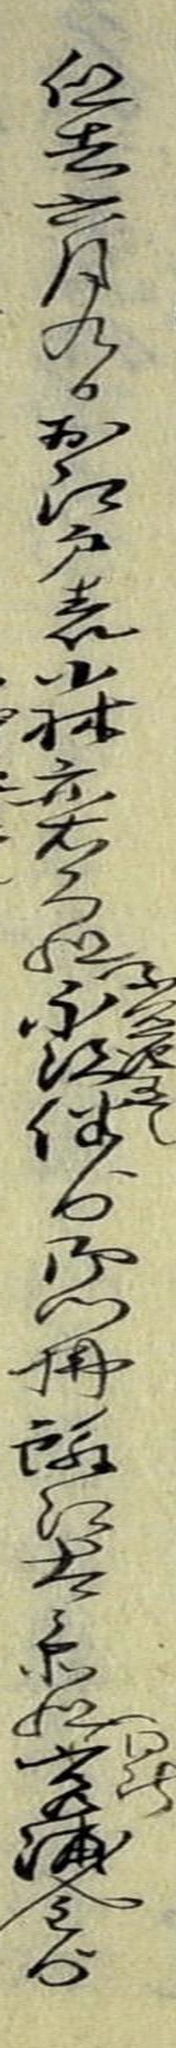但去六月九日於江戸表小林亦右衛門組―不宜儀有之永沢伴右衛門御門払蟹江太兵衛組―同断宮浦？金右衛門
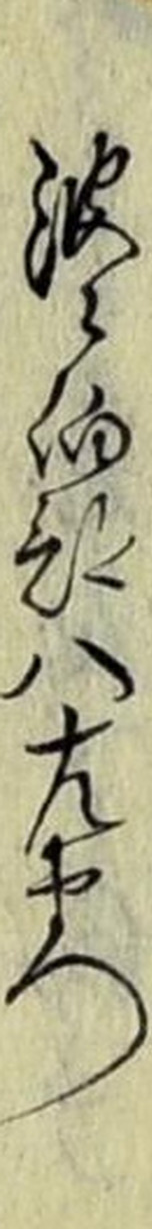覚波々伯部八左衛門
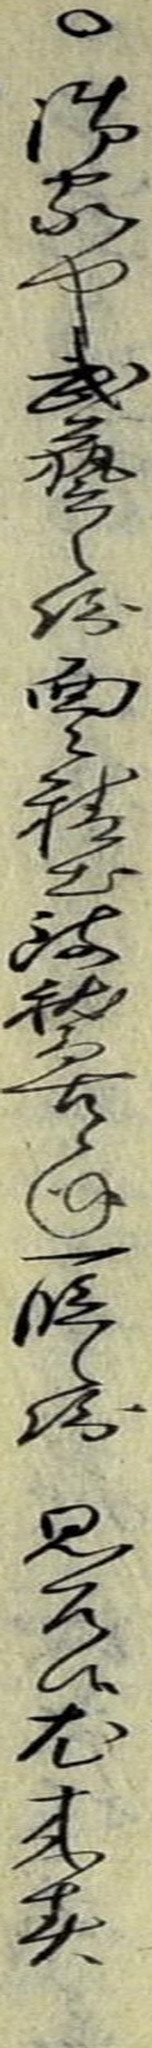〇御家中武芸之儀面々精出致稽古候趣一段之儀思召候尤来春
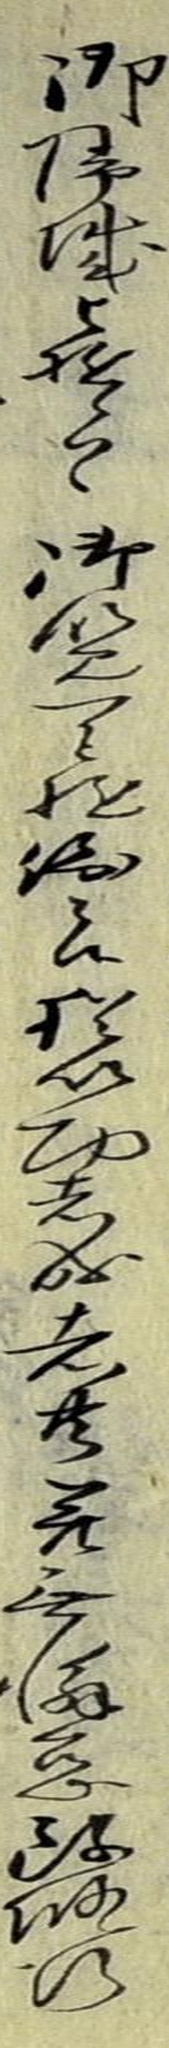御帰城被遊候ハヽ御覧可被遊儀ニ候猶以巧者成者共并無懈怠致修行
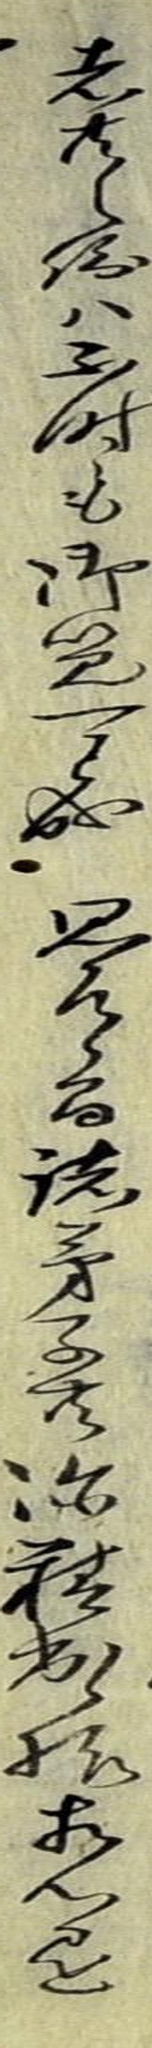者共之儀ハ不時ニも御覧可被成思召候間諸弟子共弥精出候様相心懸
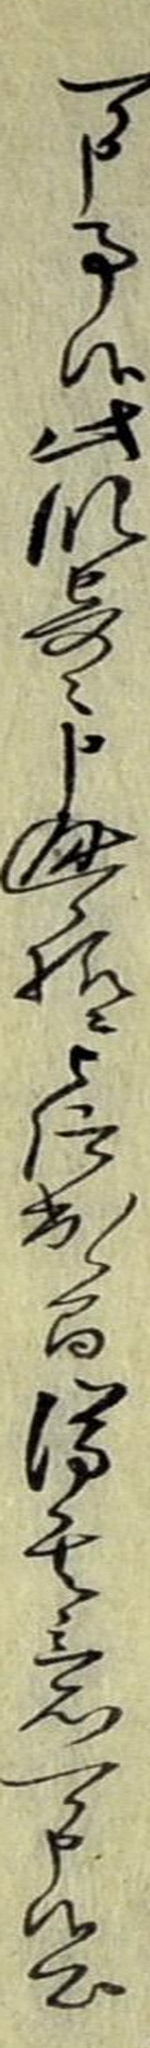可申事候此段寄々申通候様ニ被仰出候間得其意可申候以上
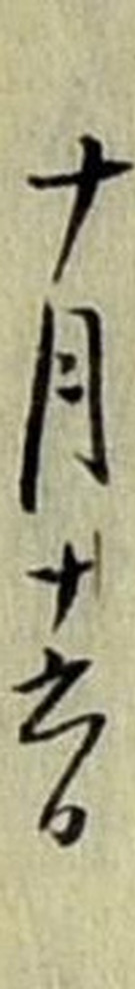十月十六日
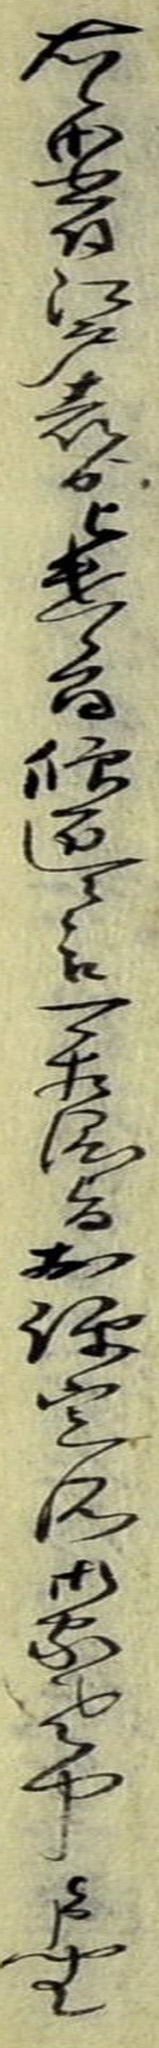右之御書付江戸表ゟ被遣候間師匠々々江可相渡旨於評定所御家老中被申聞候

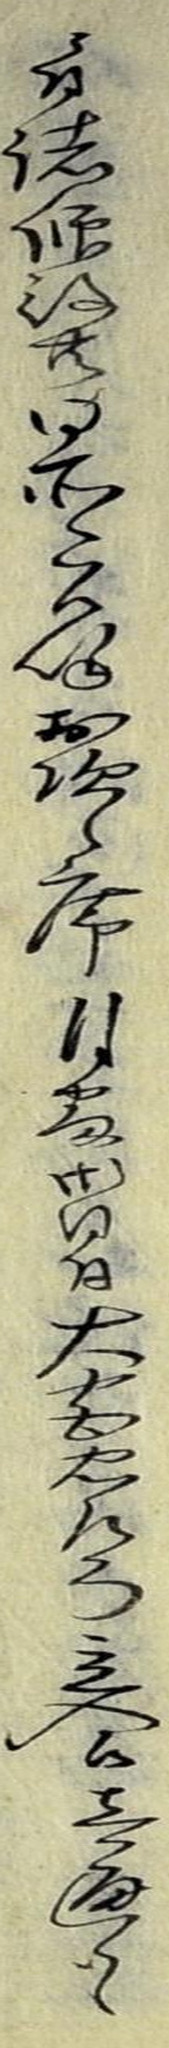ニ付諸師役共同所へ召呼於次之席月番御目付大宮忠左衛門立合壱通ツヽ
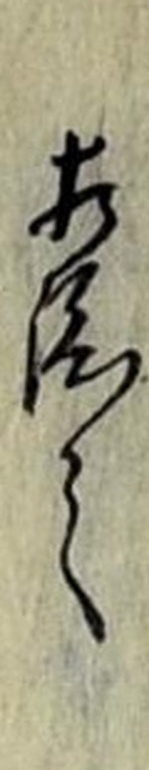相渡之
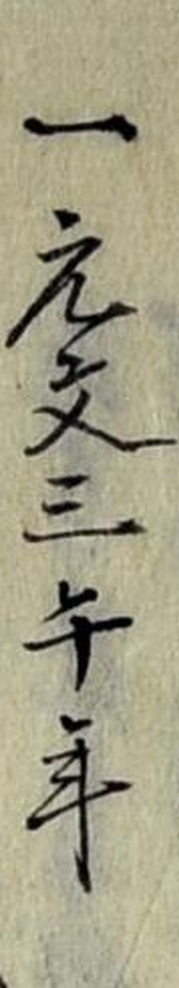一元文三午年
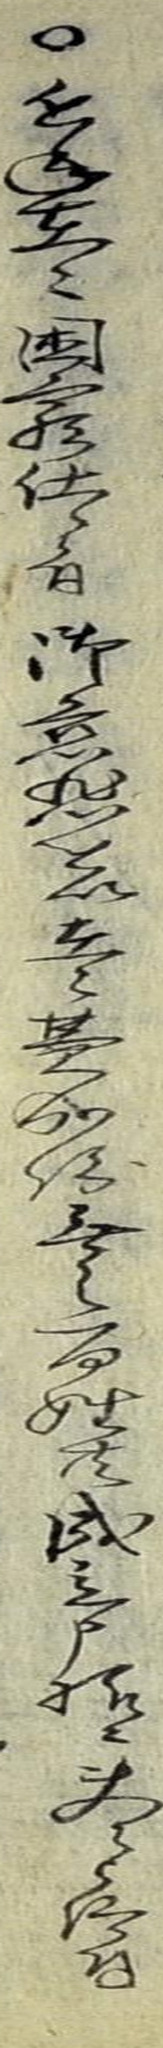〇近年在々困窮仕候ニ付御慈悲を以在々費成儀無之百姓共成立申様ニ夫々被仰付
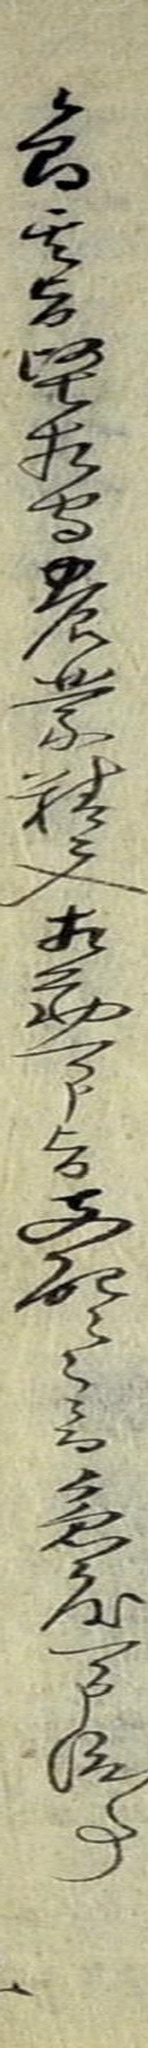候間其旨堅相守農業精ニ入相勤可申旨支配々々ニ而急度可申渡事
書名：命令之部 一
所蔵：福井県文書館 Fukui Prefectural Archives
